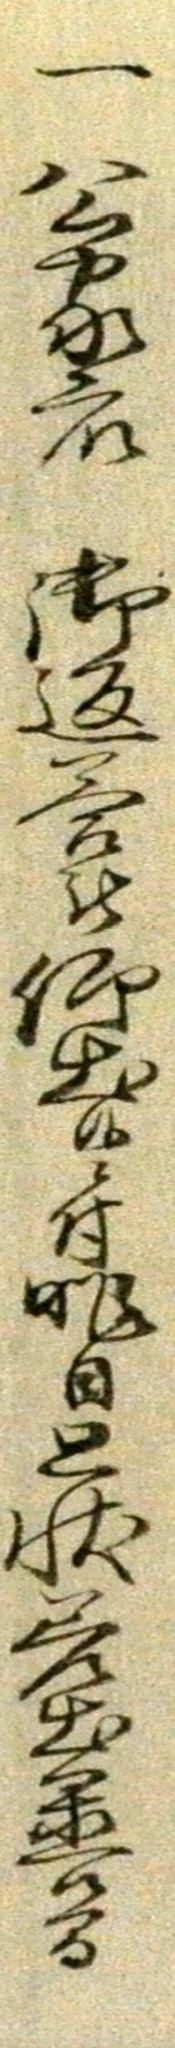一公家衆御返答被仰出候ニ付昨日廻状差出置候間
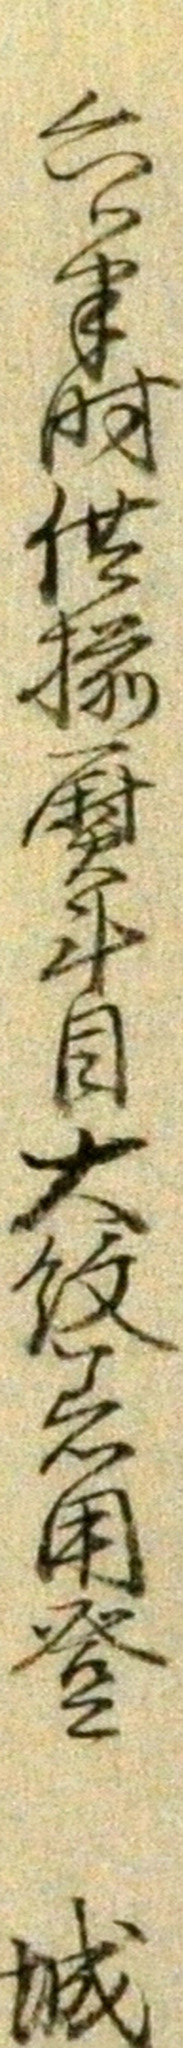六ツ半時供揃熨斗目大紋着用登城
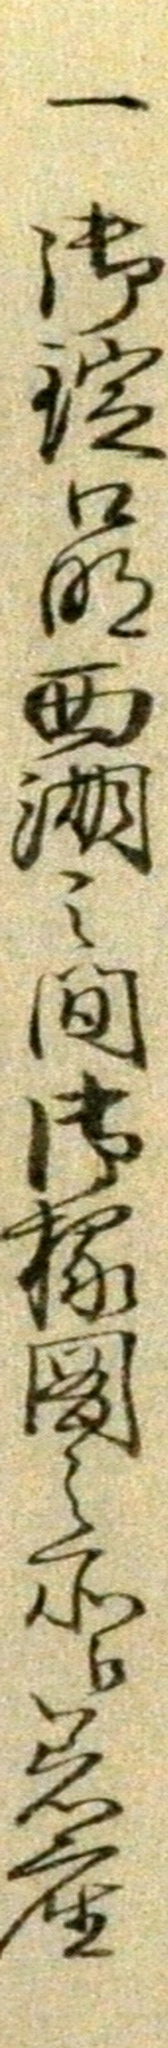一御錠口明西湖之間御椽図之所え着座
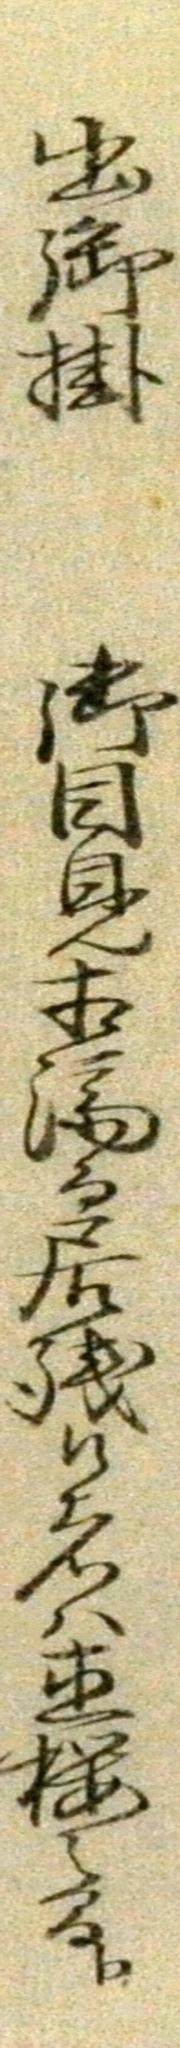出御掛御目見相済而居残候者ハ直桜之間え
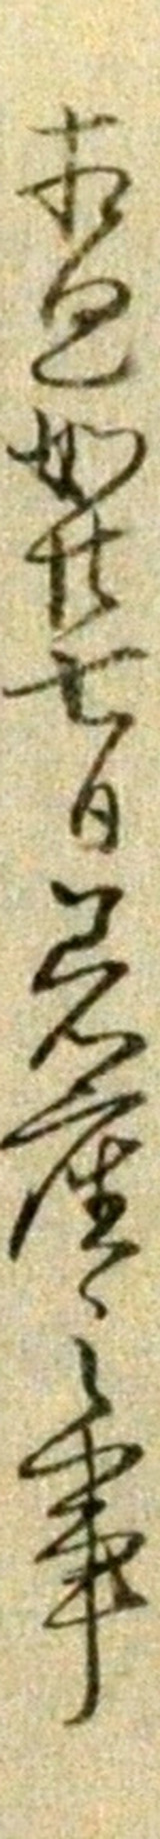相廻如廿七日着座之事
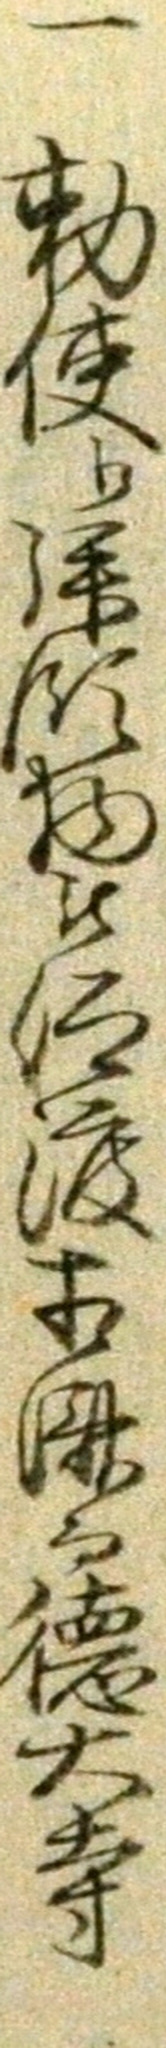一勅使え拝領物被仰渡相済而徳大寺
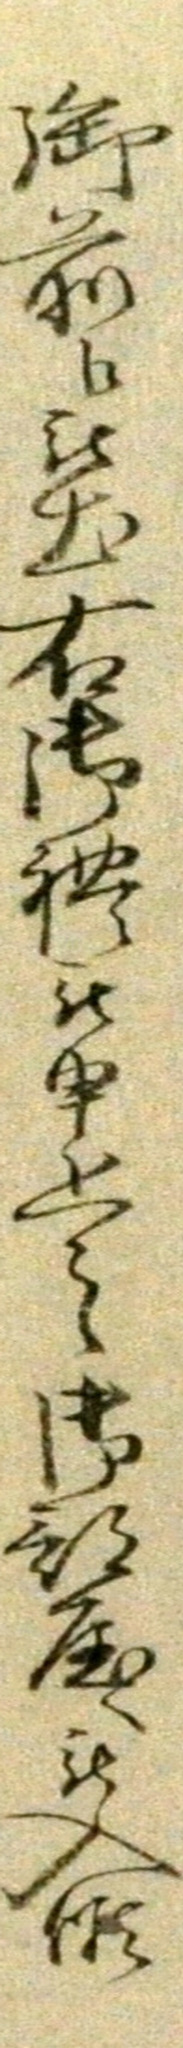御前え被出右御礼被申上之御部屋へ被入候
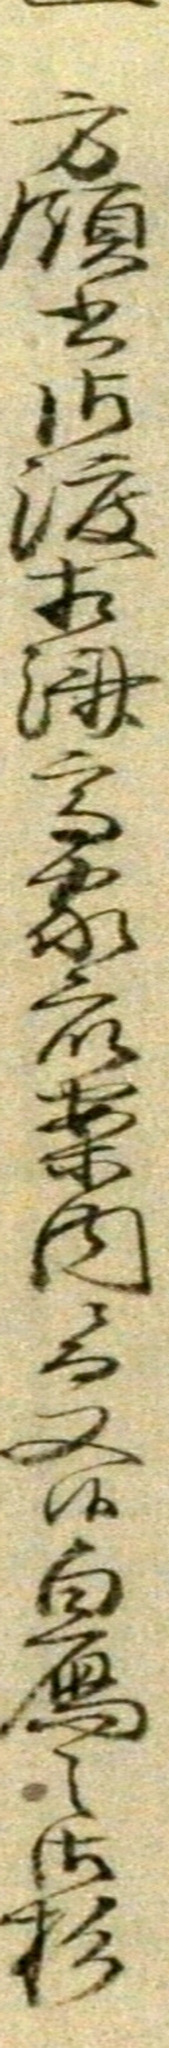一方領書御渡相済高家衆案内ニ而又候白鴈之御杉
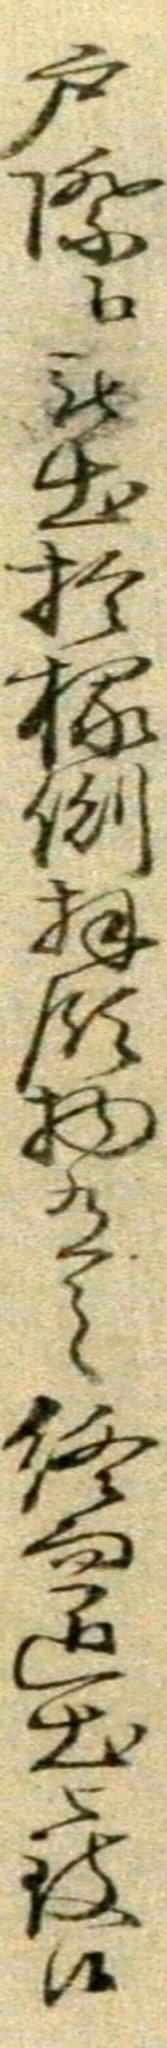戸際え罷出於椽側拝領物有之終而退出被致候
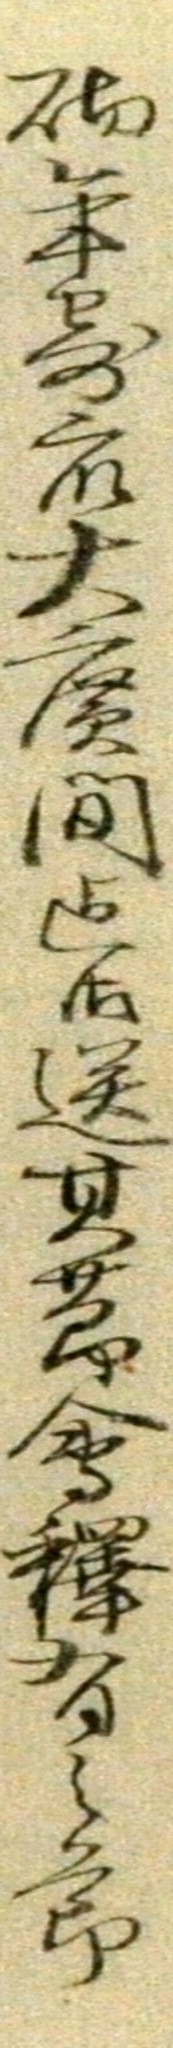砌年寄衆大広間迄御送其節会釈有之節
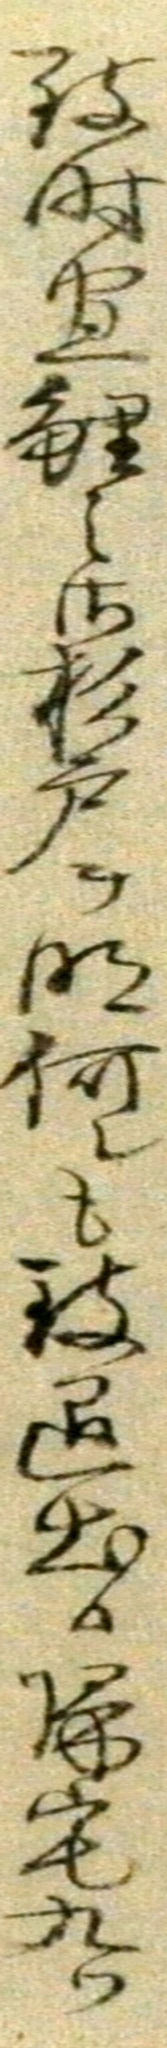致時宜鯉之御杉戸ヲ明何レも致退出候帰宅九ツ
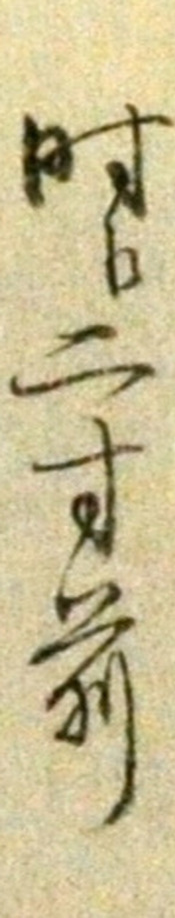時え二寸前
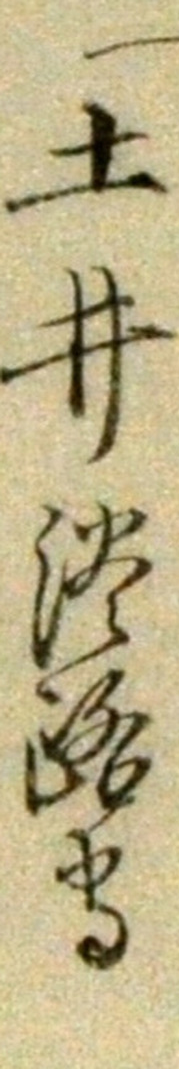土井淡路守

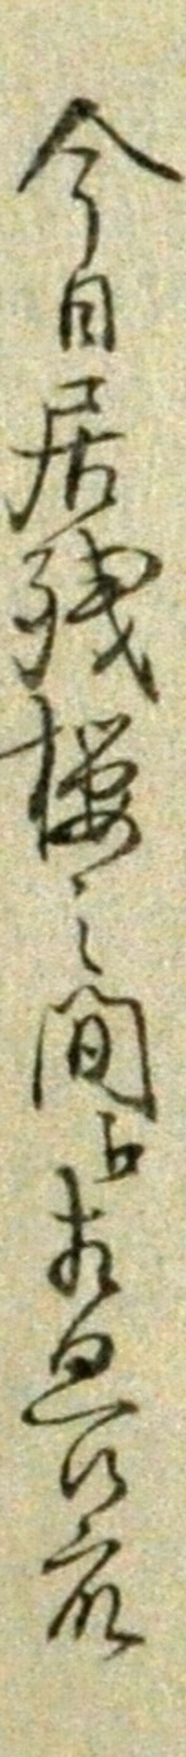今日居残桜之間え相廻候衆
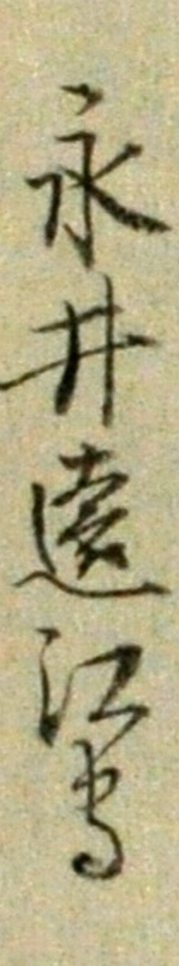永井遠江守
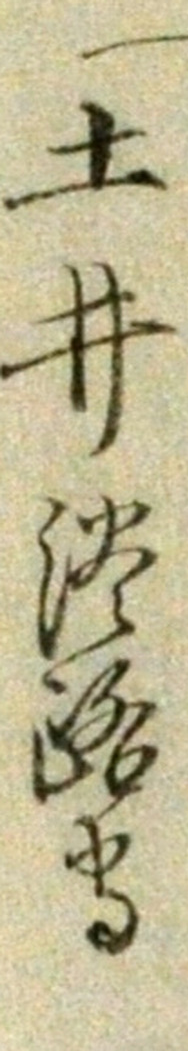土井淡路守
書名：諸留書〔一括〕
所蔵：伊那市立高遠町図書館・合同会社AMANE
